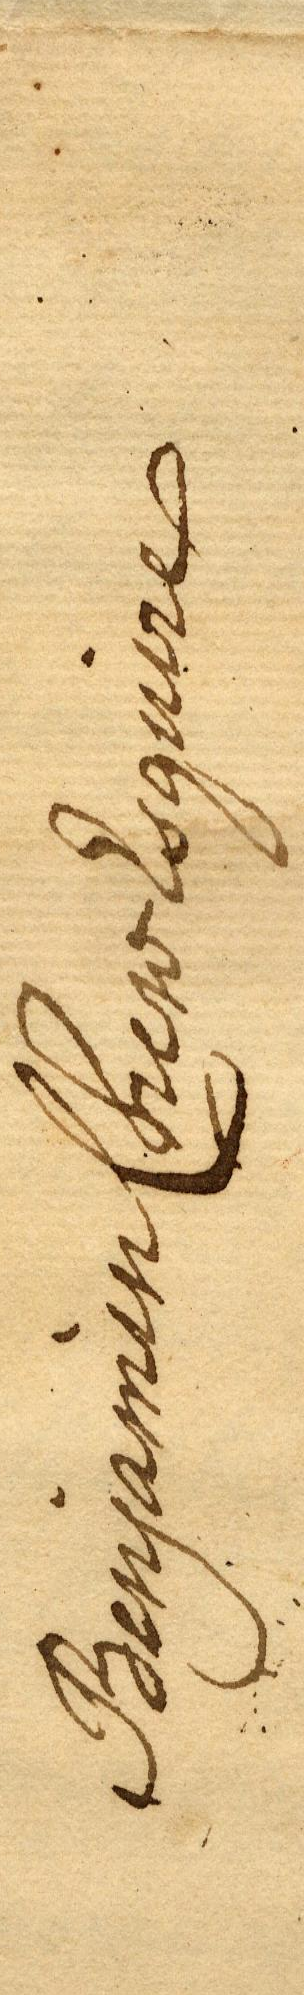Benjamin Chew Esquire
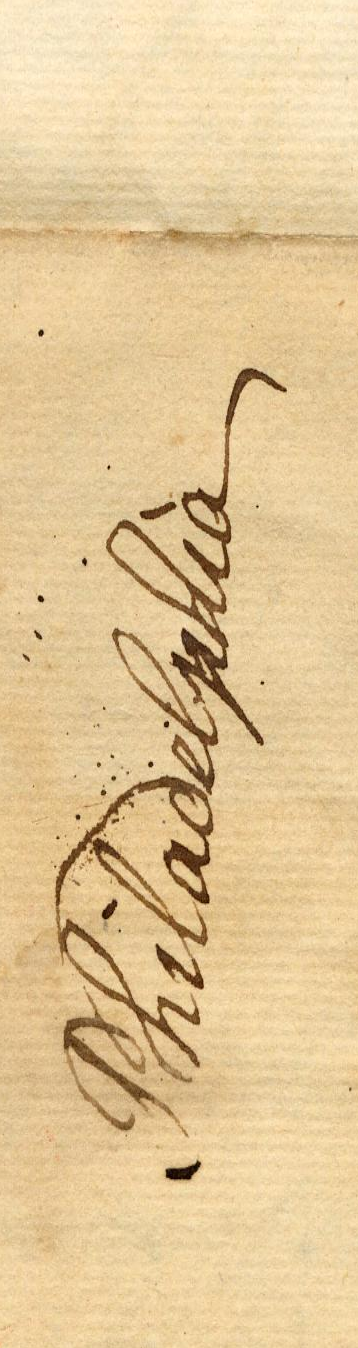Philadelphia
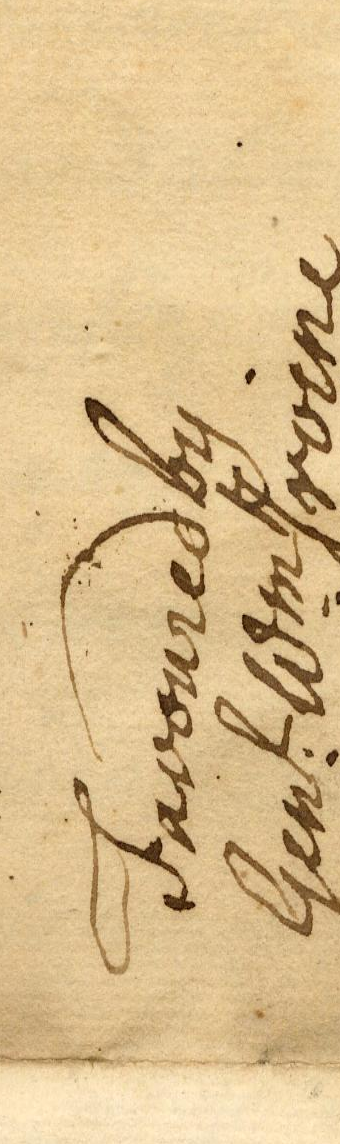Favoured by
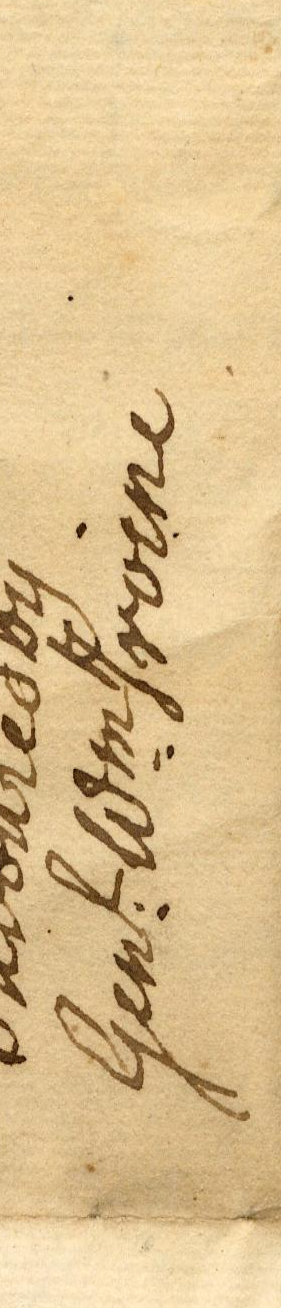Gen^l: W^m: Troine
